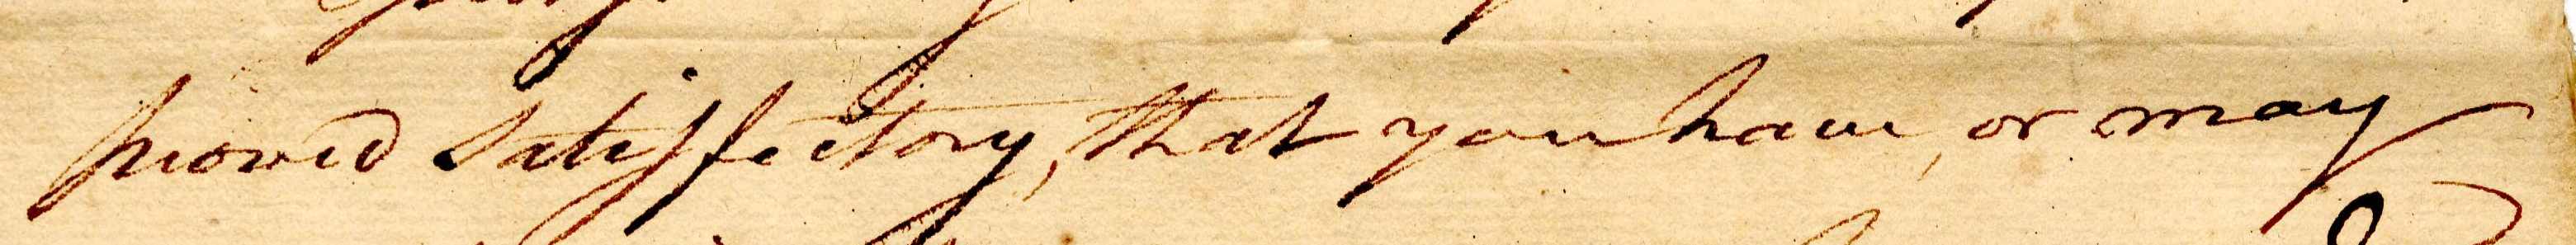proved Satisfactory, that you have, or may
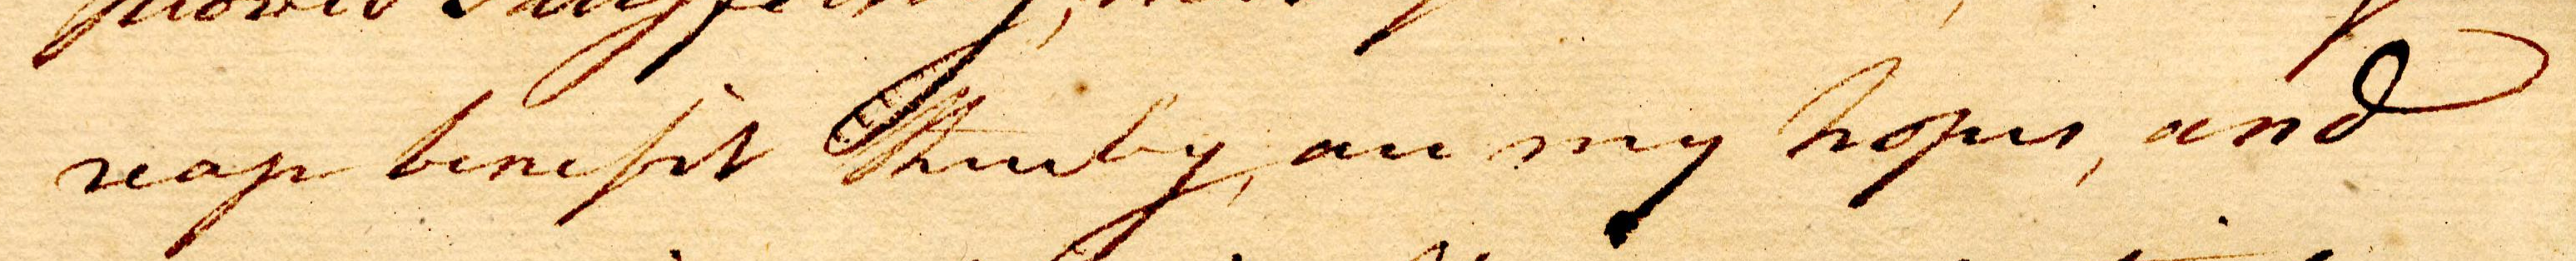reap benefit truly, are my hopes, and
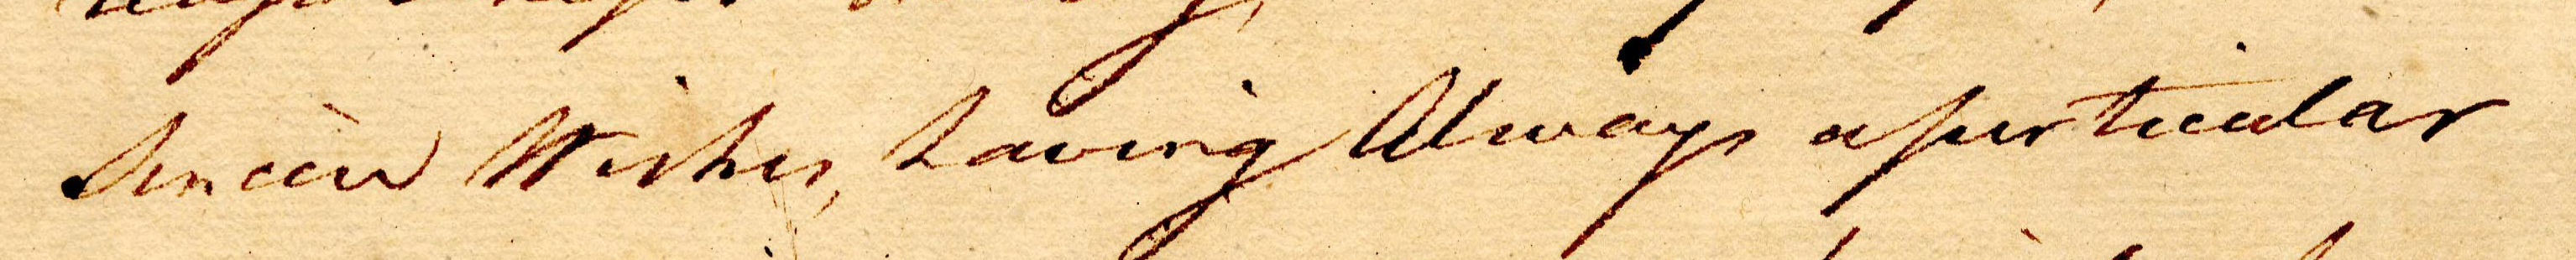Sincere Wishes, having Always a perticular
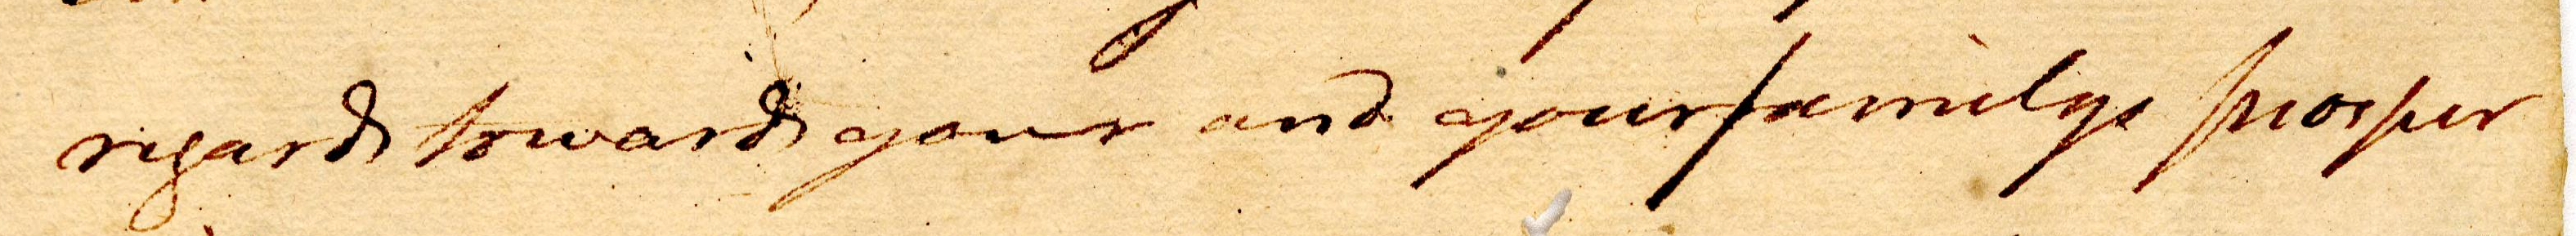regards toward your and your familys prosper
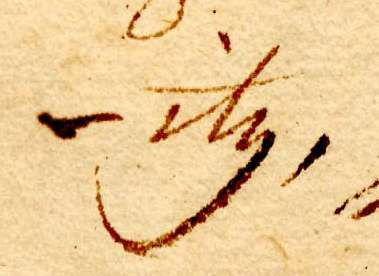-ity,
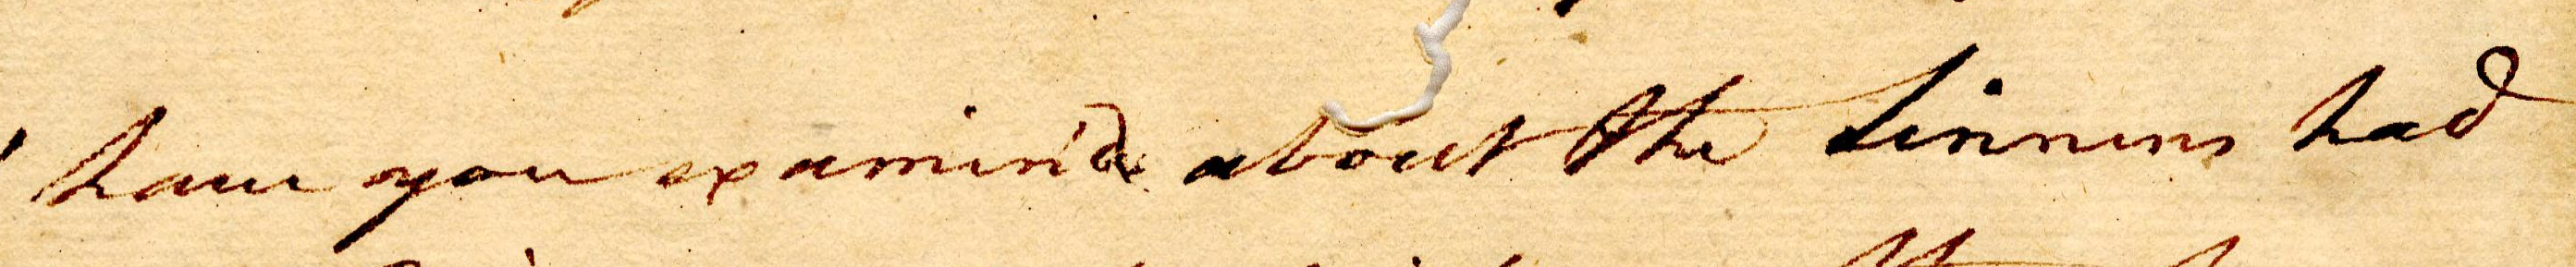have you examin'd about the Linnens had
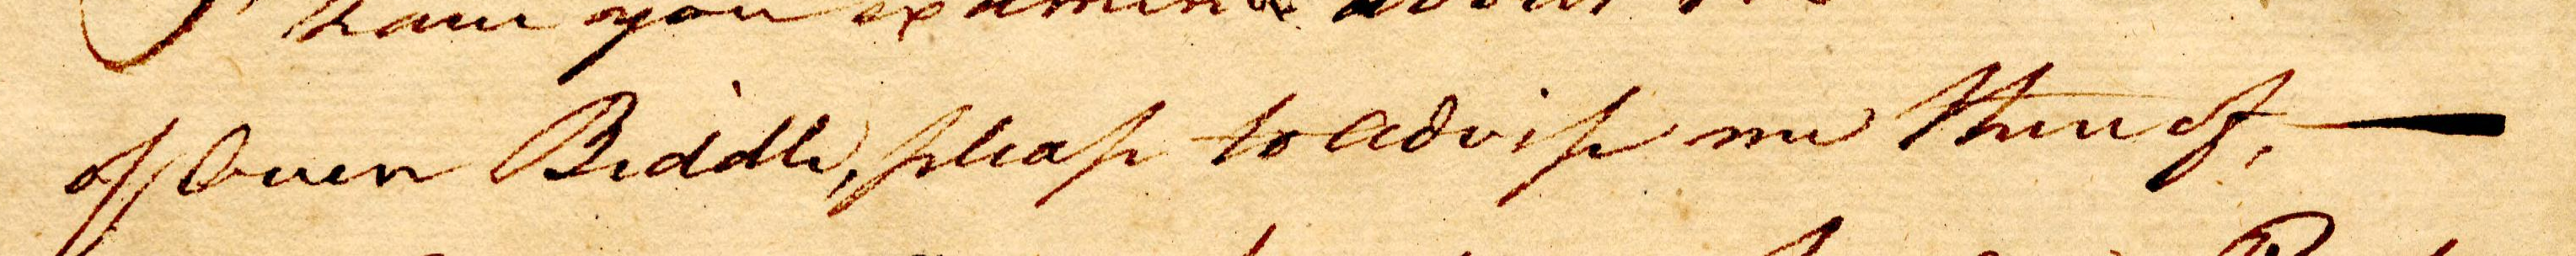of Owen Biddle, please to advise me there of,
